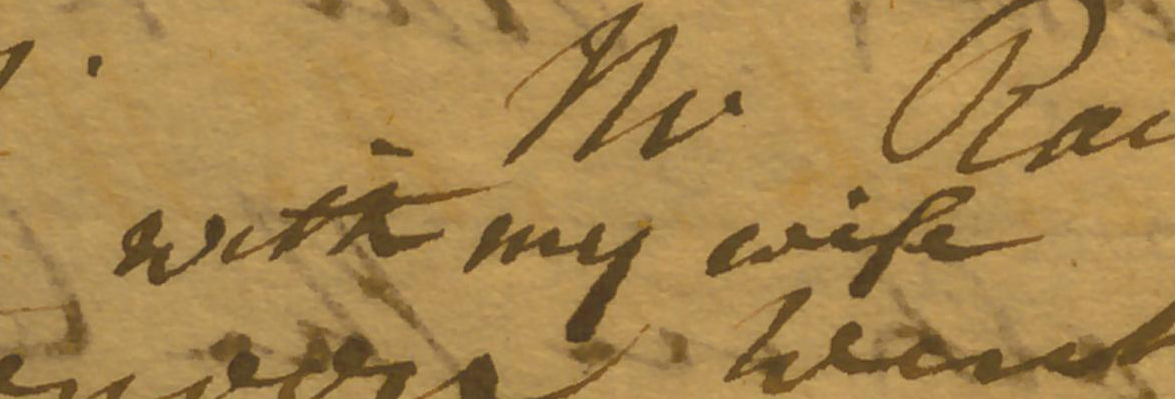with my wife
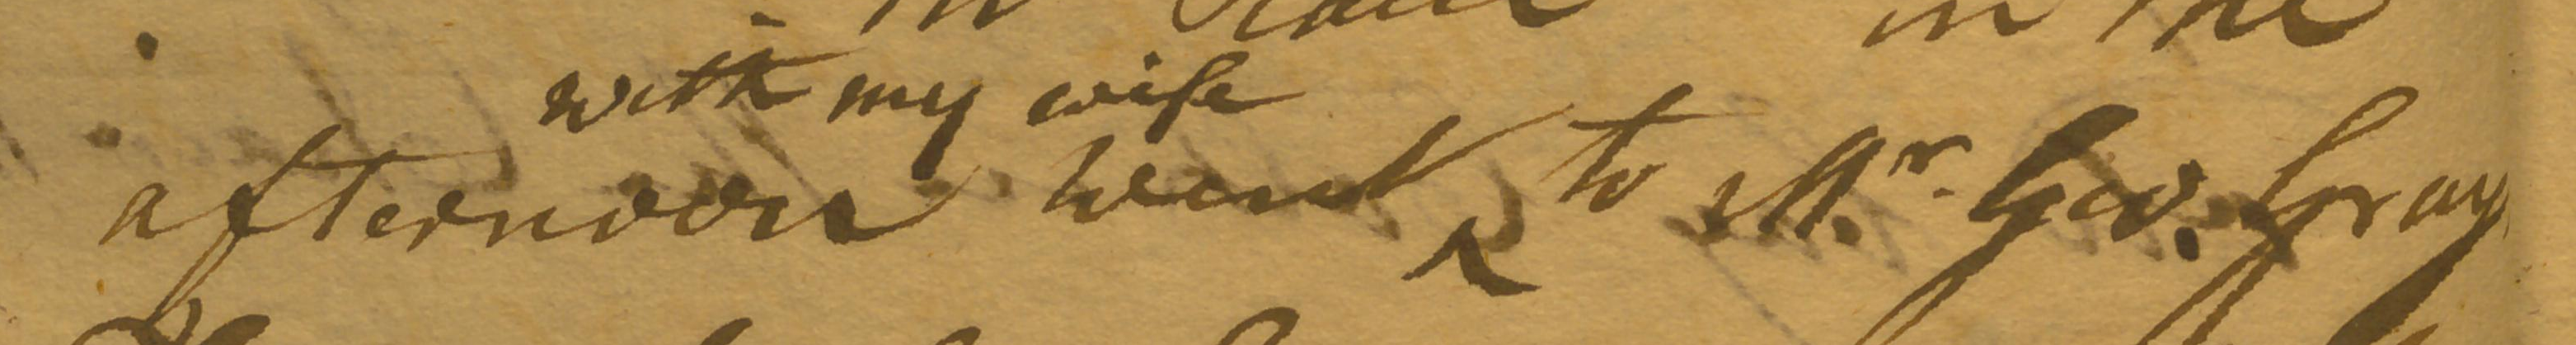afternoon went ^ to M^r. Geo. Gray
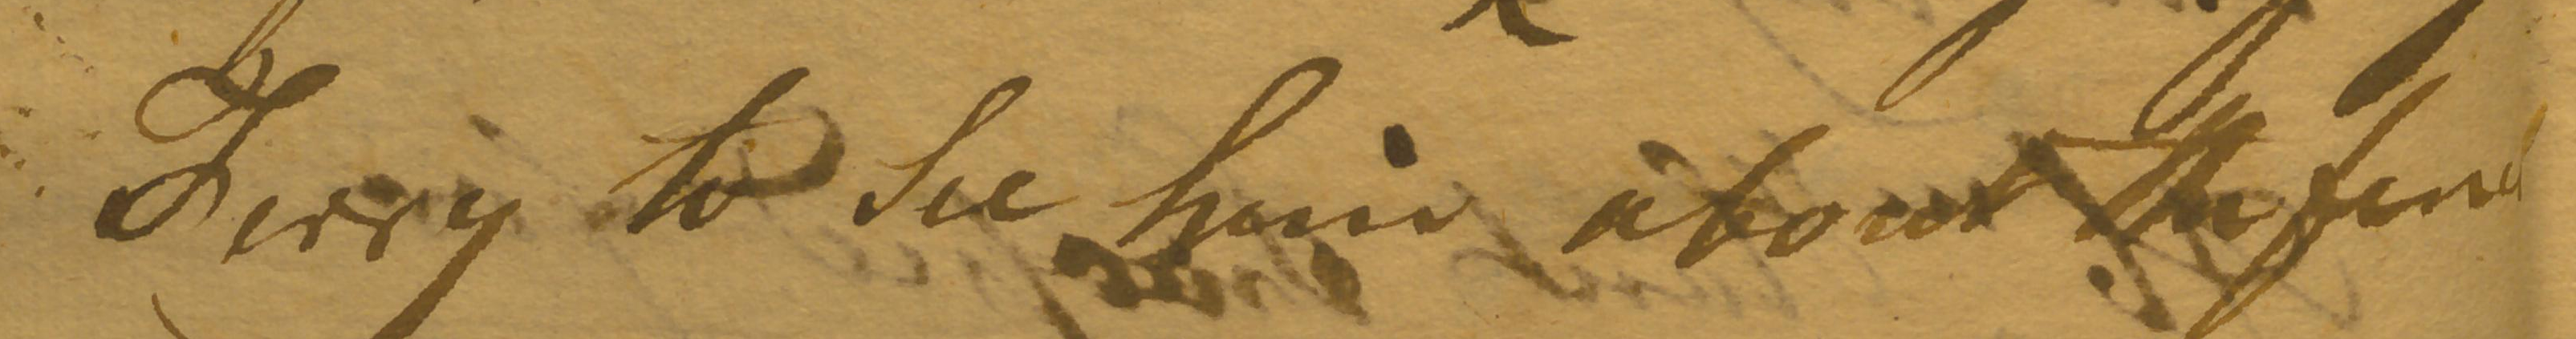Ferry to see him about the fence
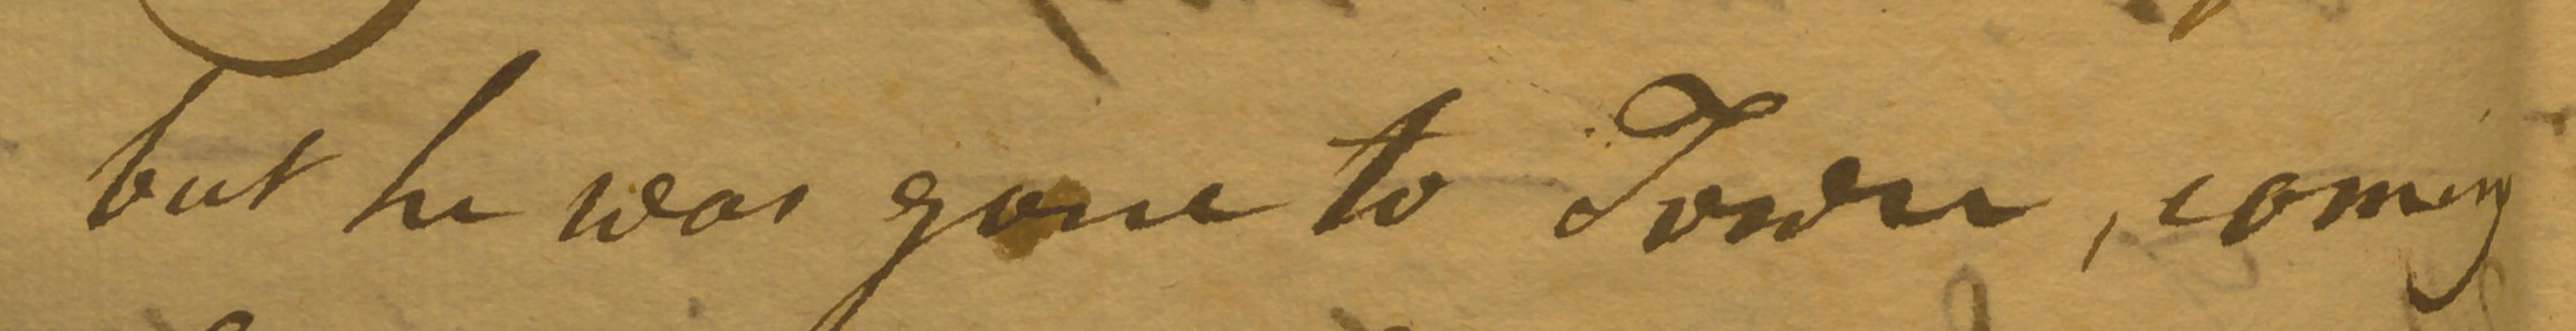but he was gone to Towne, coming
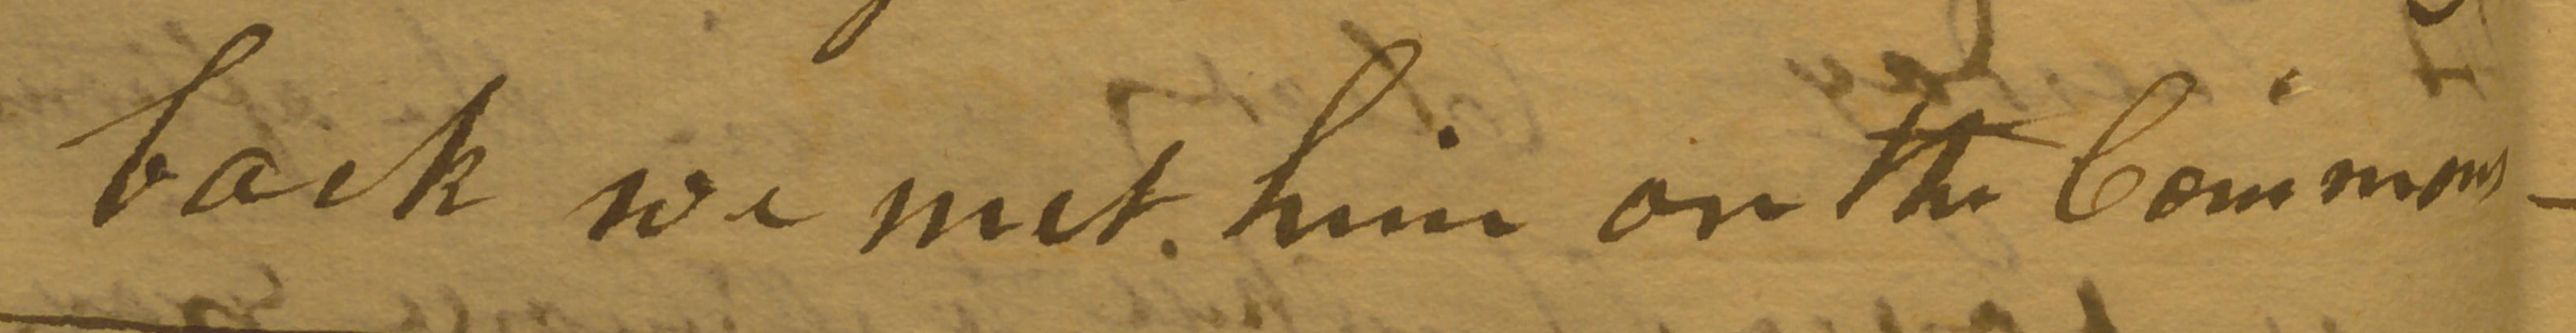back we met him on the Commons
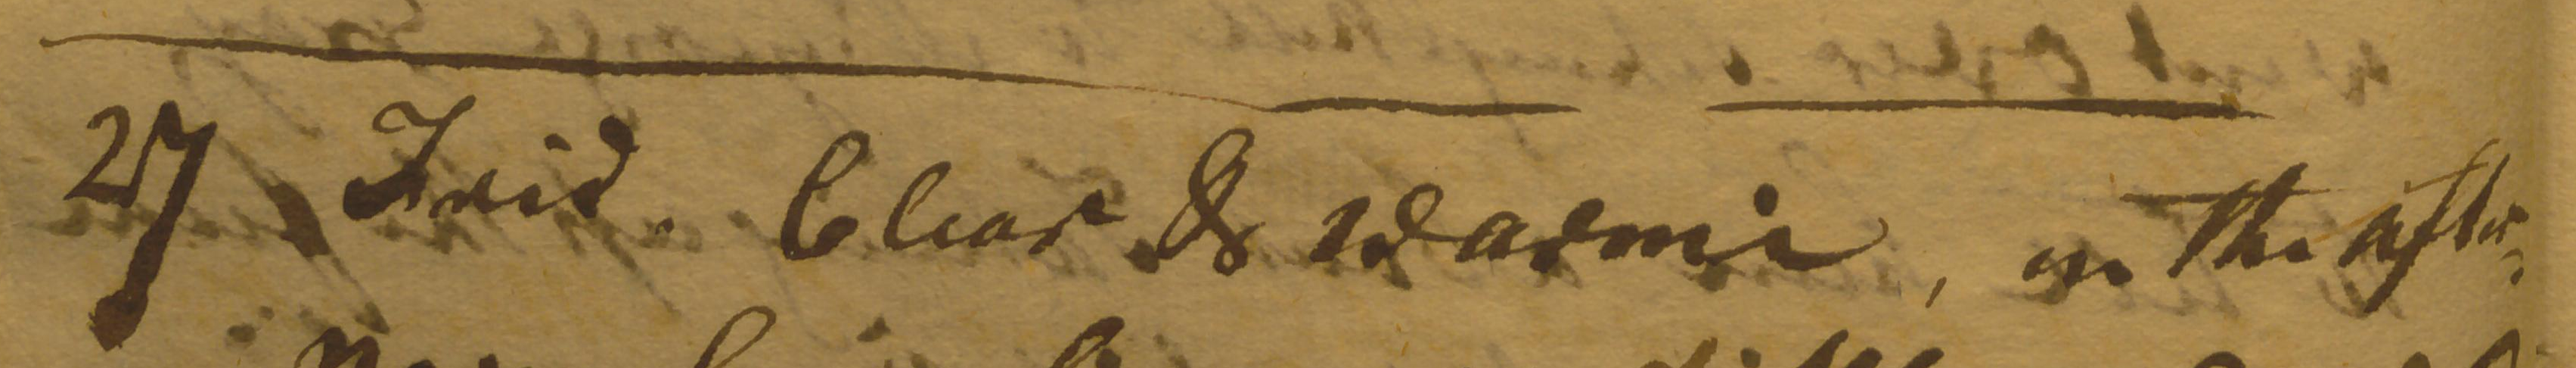279 Frid. Clear & Warme, in the after-
